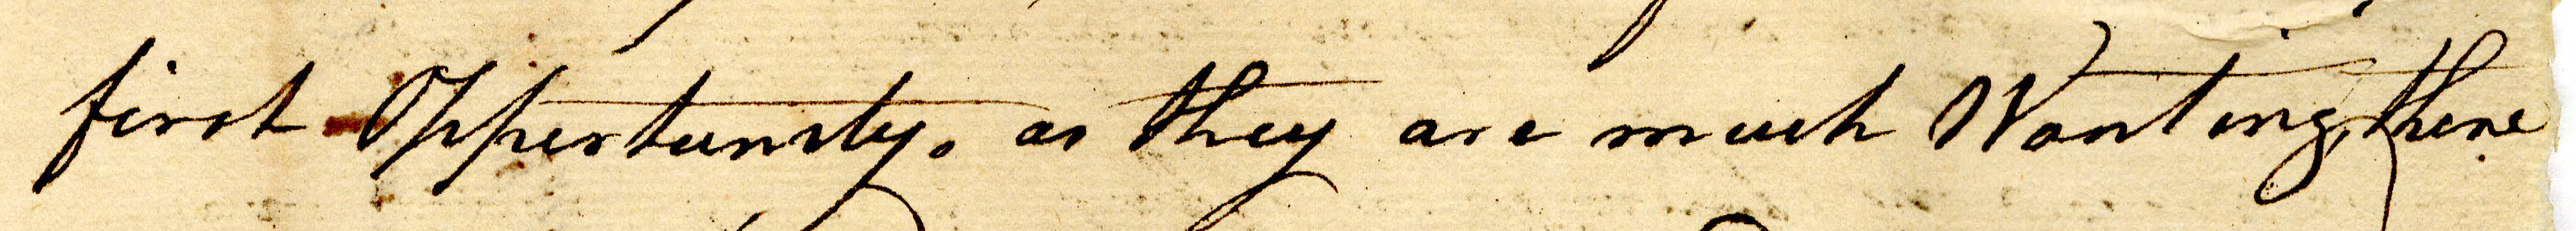first Oppertunity as they are much Wanting. There
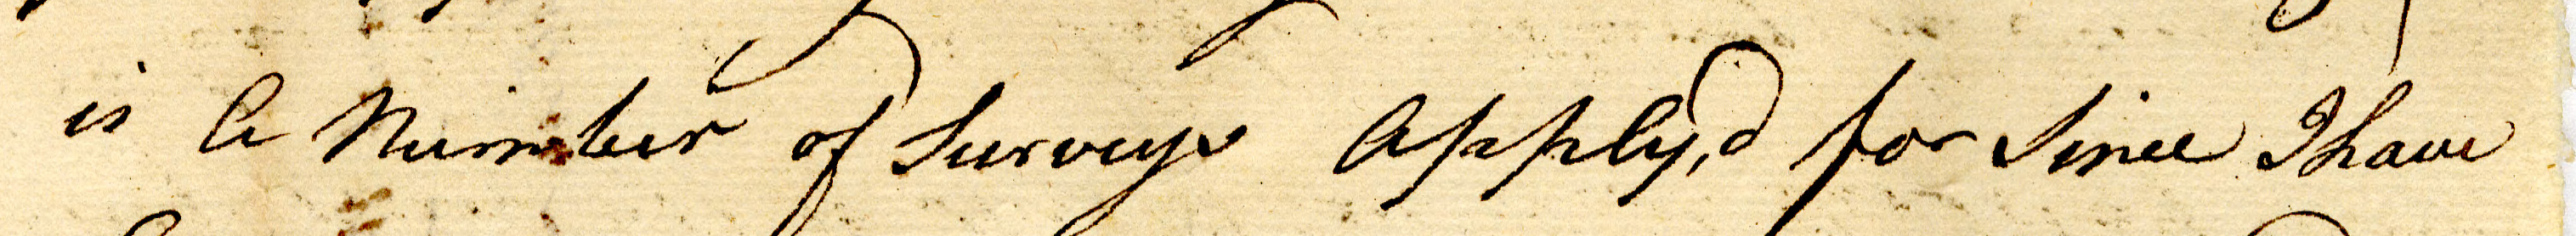is a number of surveys apply,d for since I have
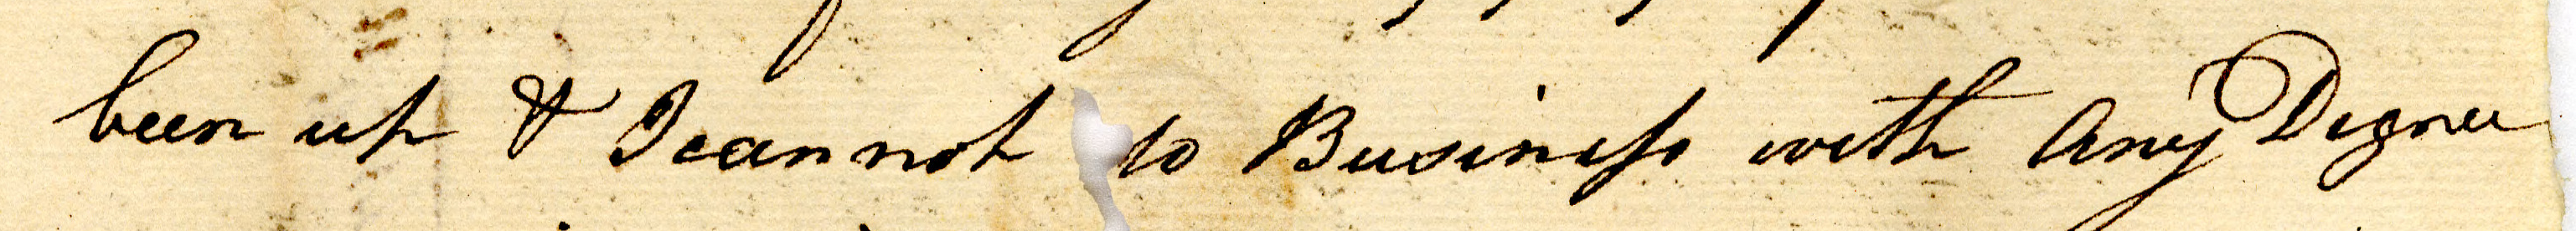been up & I cannot do Business with any Degree
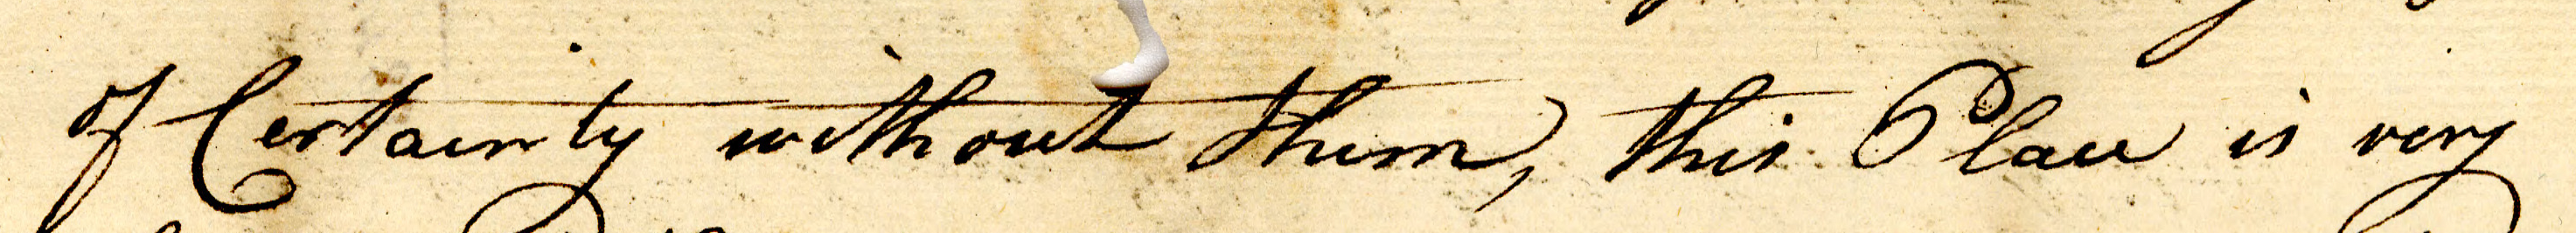of Certainty without them, this Place is very
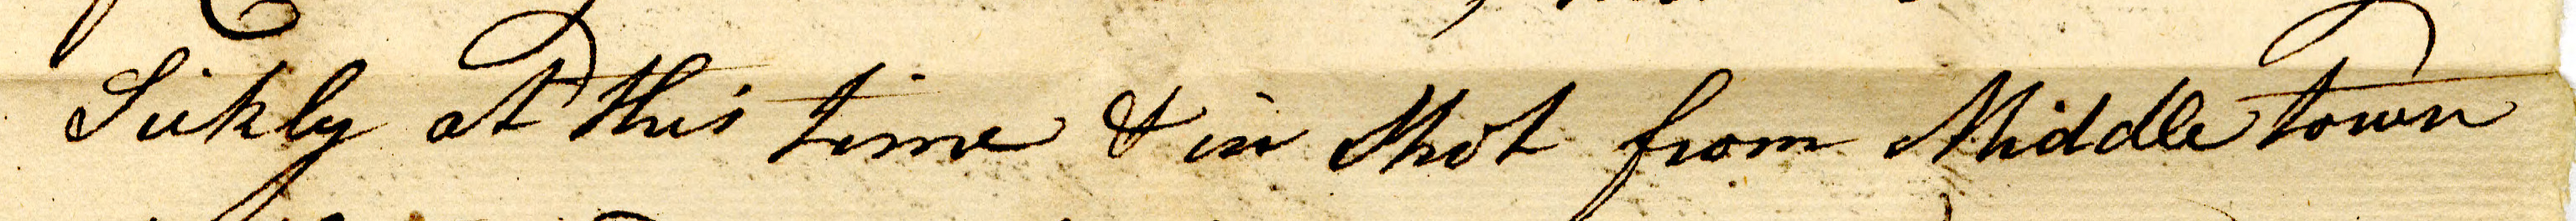Sickly at this time & in shot from Middletown
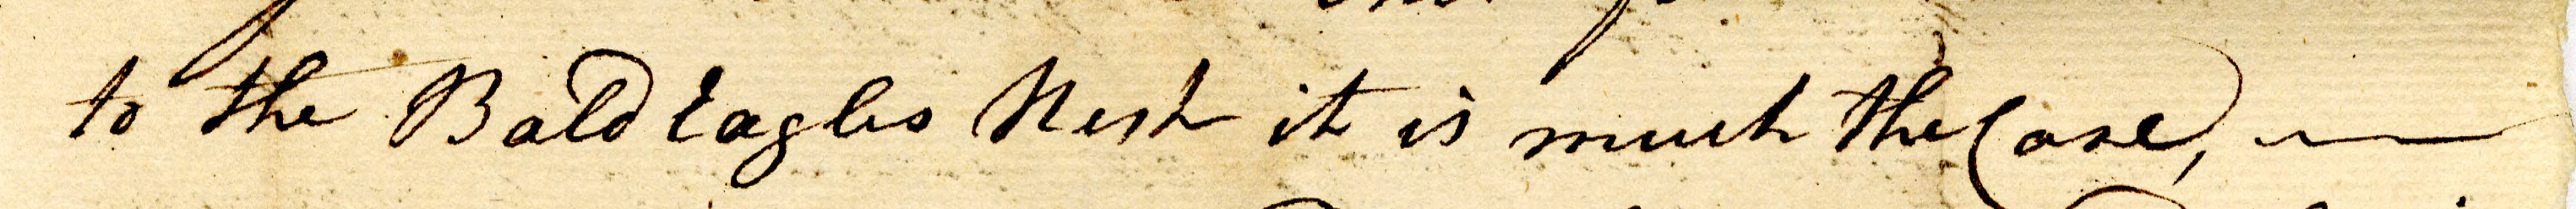to the Bald Eagles Nest it is much the case-
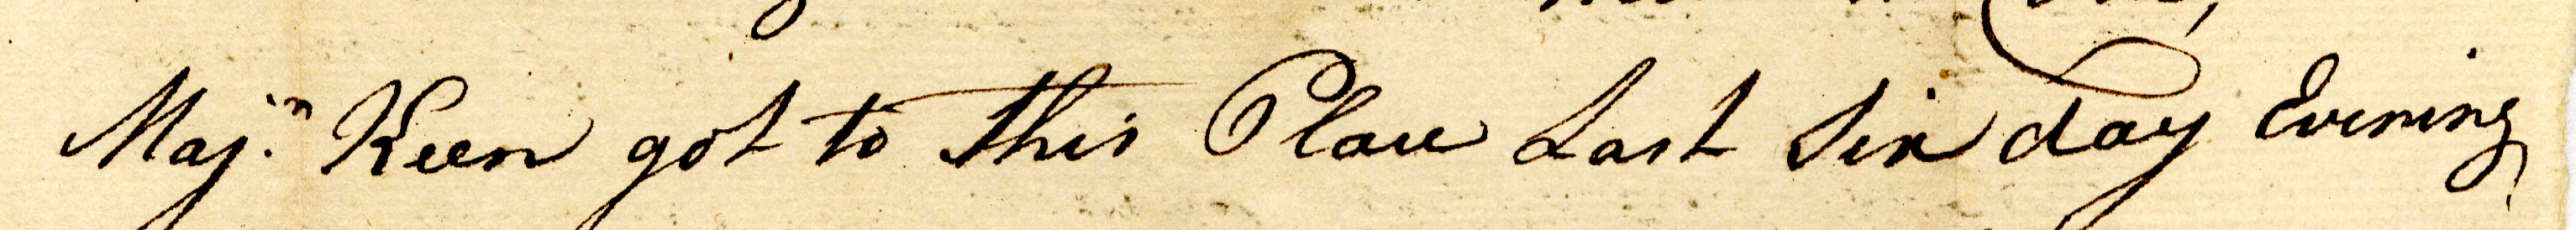Maj^r. Keen got to this Place Last Sunday Evening
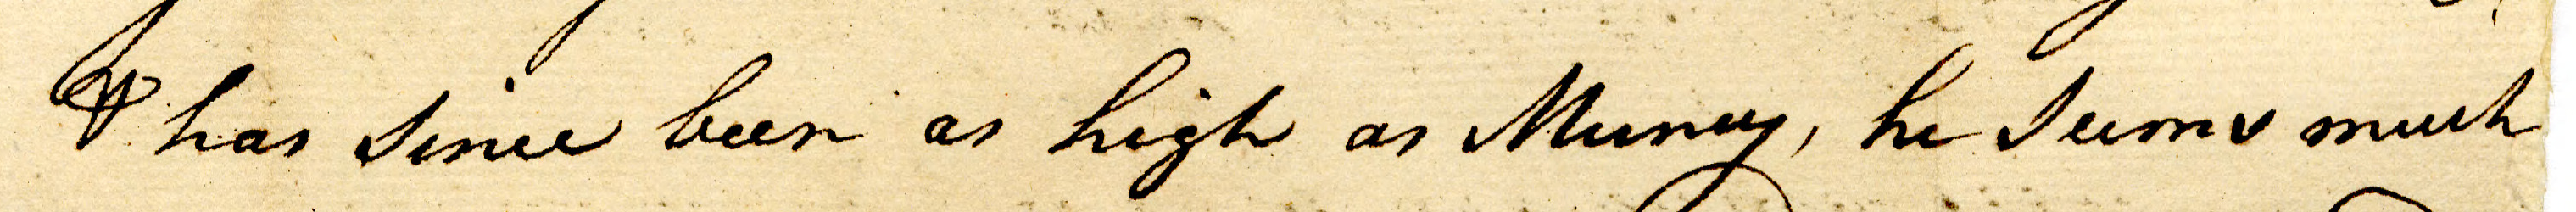& has since been as high as Muney, he seems much
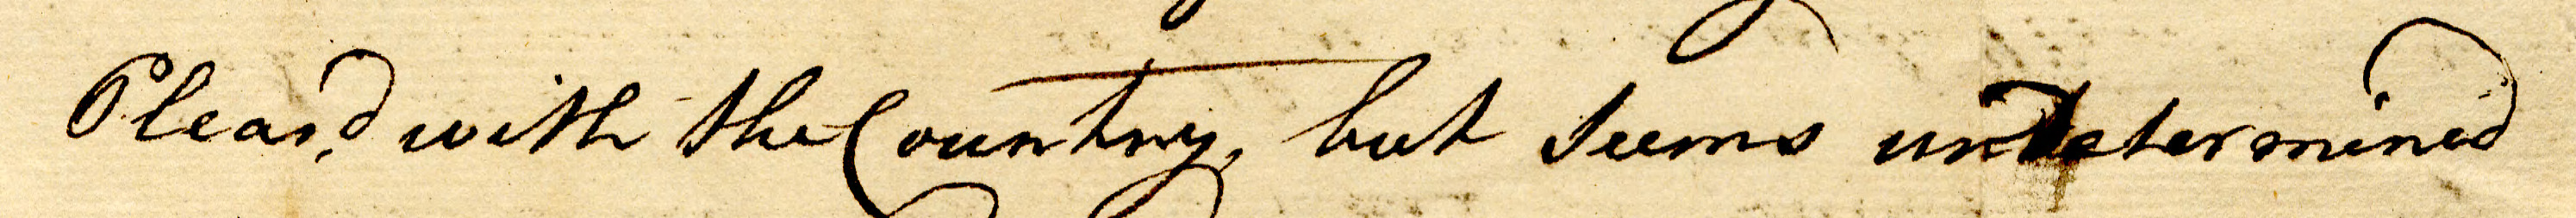Pleas,d with the country, but seems undetermined
